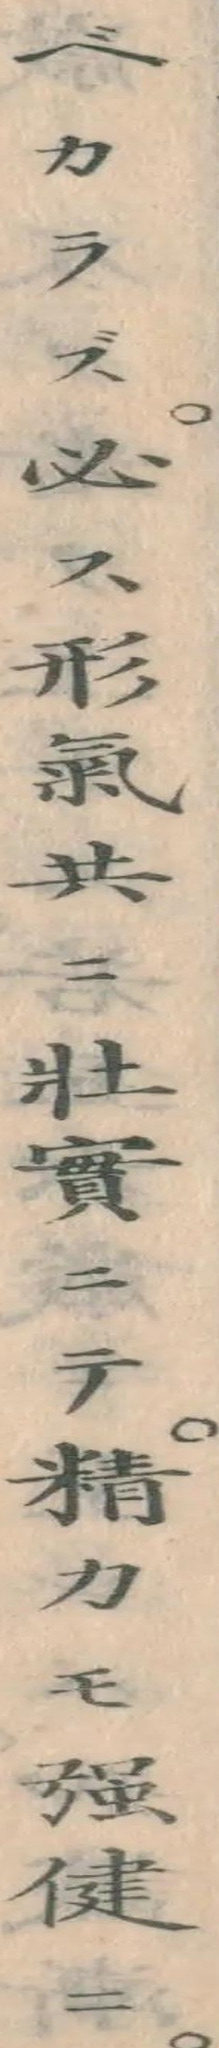ベカラズ。必ス形気共ニ壮実ニテ。精力モ強健ニ。
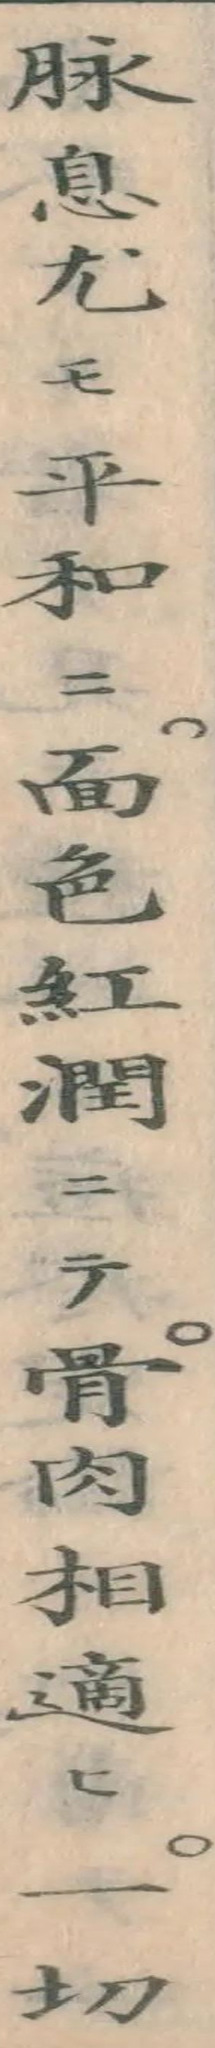脉息尤モ平和ニ。面色紅潤ニテ。骨肉相適ヒ。一切

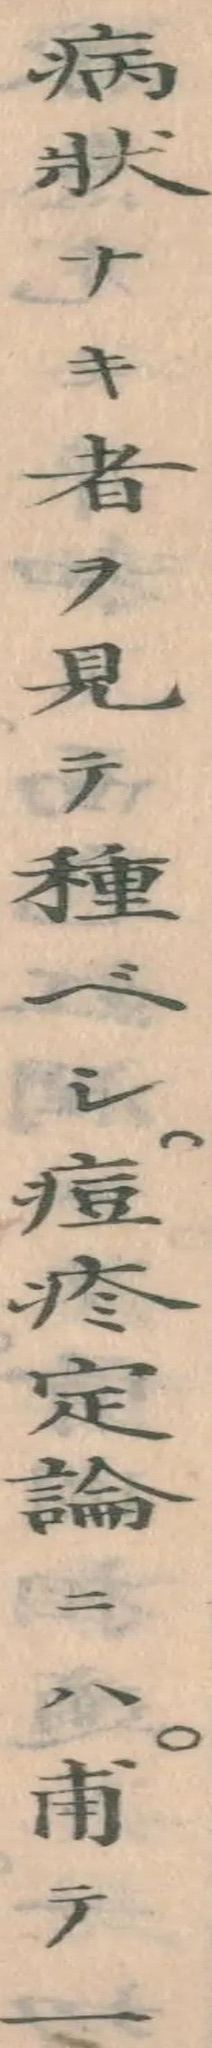病状ナキ者ヲ見テ種ベシ。痘疹定論ニハ。甫テ一
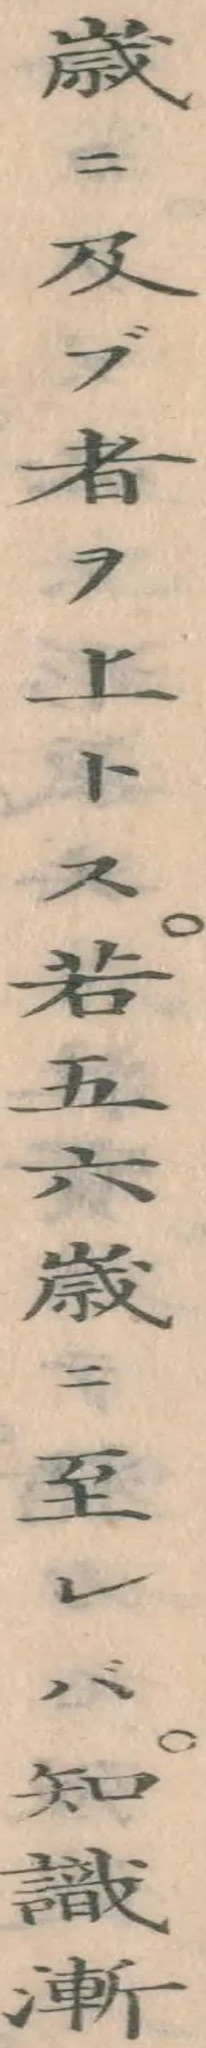歳ニ及ブ者ヲ上トス。若五六歳ニ至レバ。知識漸
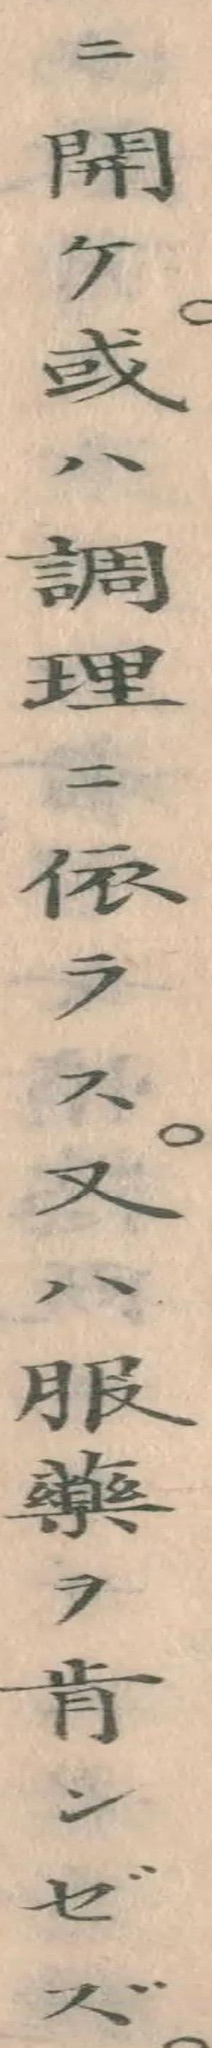ニ開ケ。或ハ調理ニ依ラス。又ハ服薬ヲ肯ンゼズ。
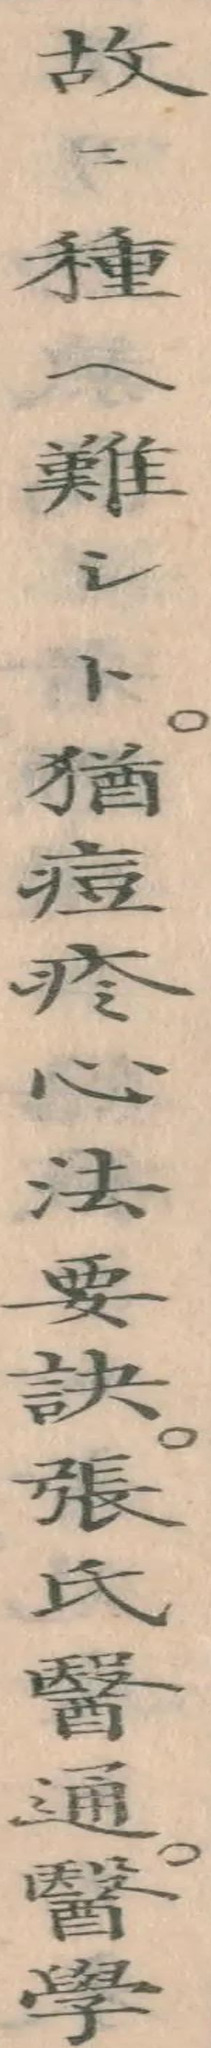故ニ種ヘ難シト。猶痘疹心法要訣。張氏医通。医学
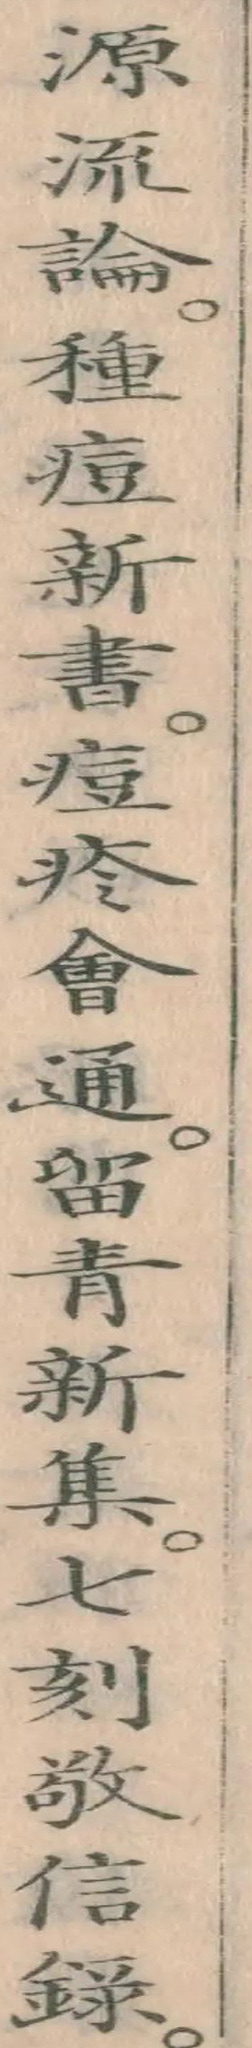源流論。種痘新書。痘疹会通。留青新集。七刻敬信録。
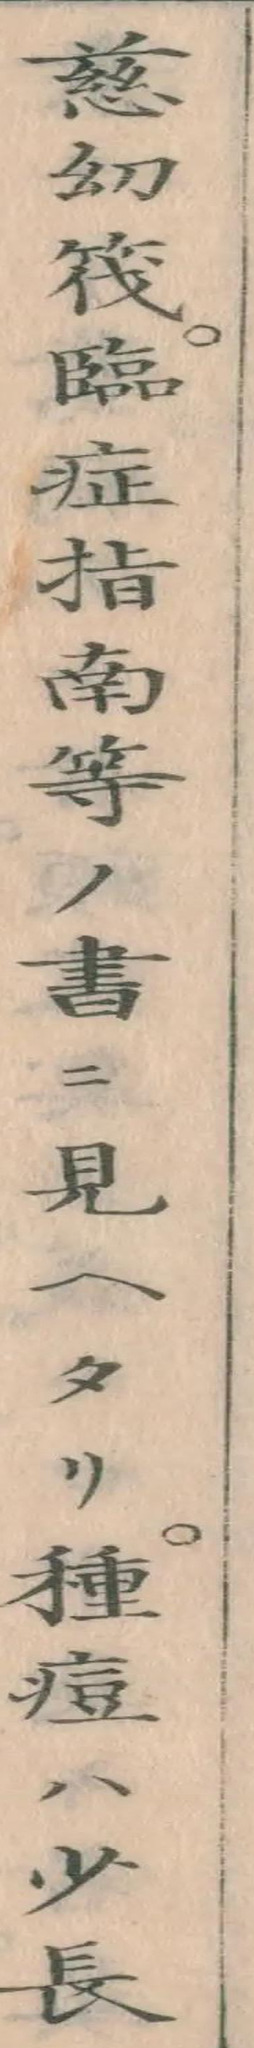慈幼筏。臨症指南等ノ書ニ見ヘタリ。種痘ハ少長
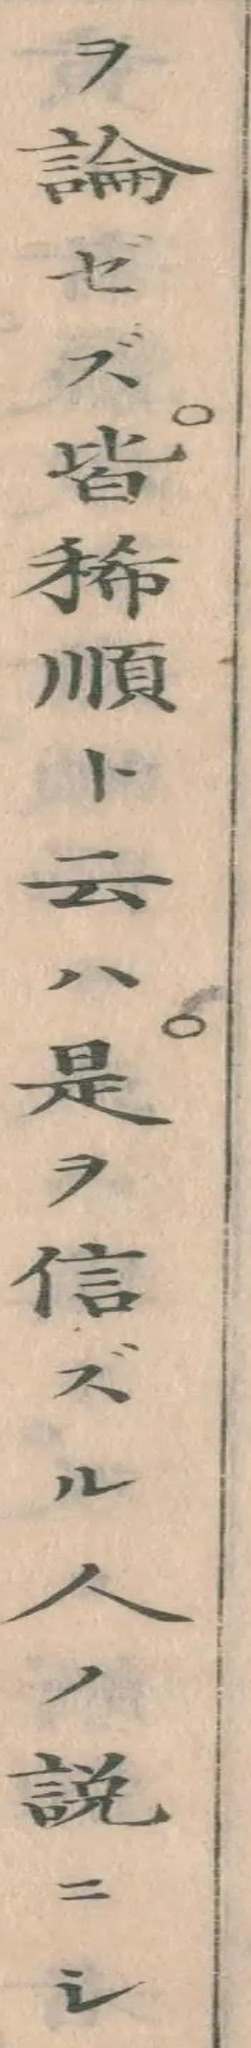ヲ論セズ。皆稀順ト云ハ。是ヲ信ズル人ノ説ニシ
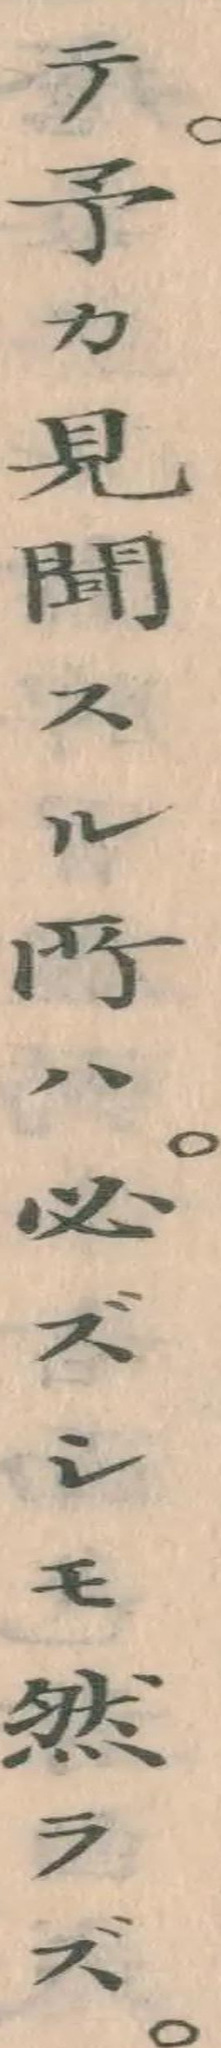テ。予カ見聞スル所ハ。必ズシモ然ラズ。
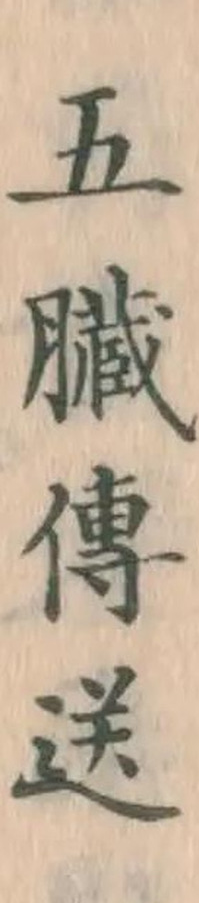五臓伝送
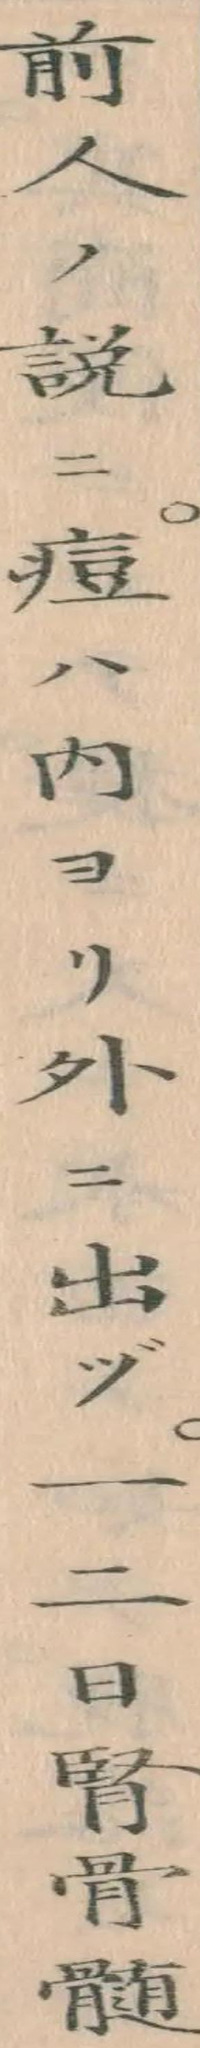前人ノ説ニ。痘ハ内ヨリ外ニ出ヅ。一二日腎骨髄
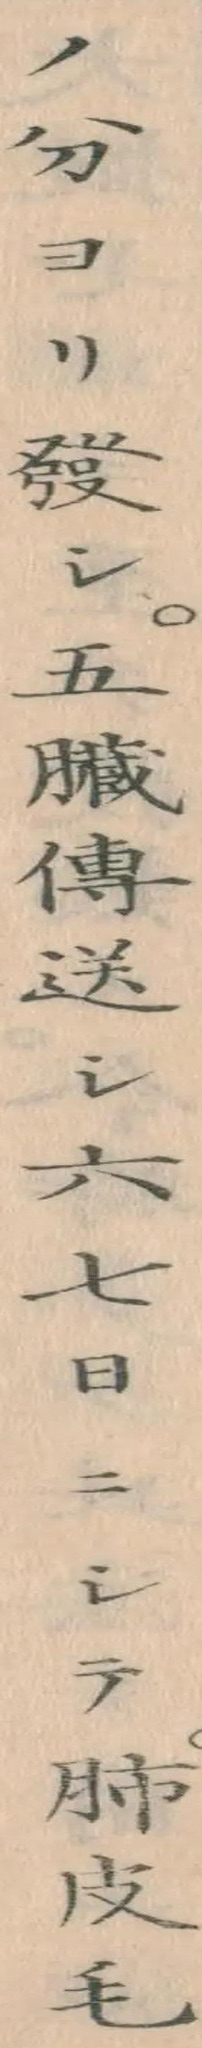ノ分ヨリ発シ。五臓伝送シ六七日ニシテ。肺皮毛
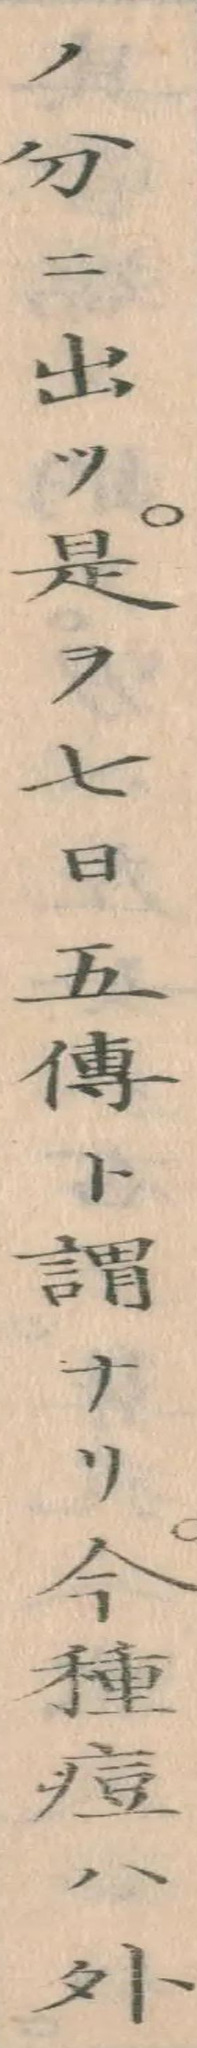ノ分ニ出ツ。是ヲ七日五伝ト謂ナリ。今種痘ハ外
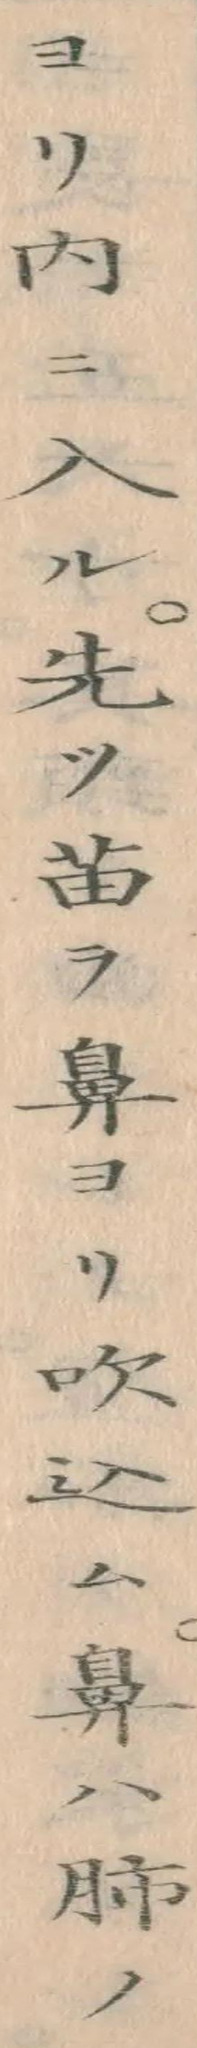ヨリ内ニ入ル。先ツ苗ヲ鼻ヨリ吹込ム。鼻ハ肺ノ
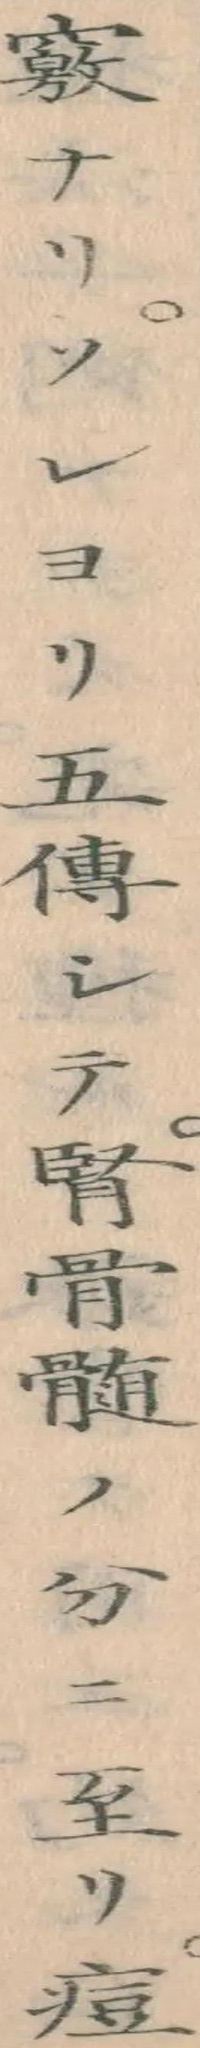竅ナリ。ソレヨリ五伝シテ。腎骨髄ノ分ニ至リ。痘
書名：種痘弁義
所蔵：国立国会図書館 National Diet Library, JAPAN
